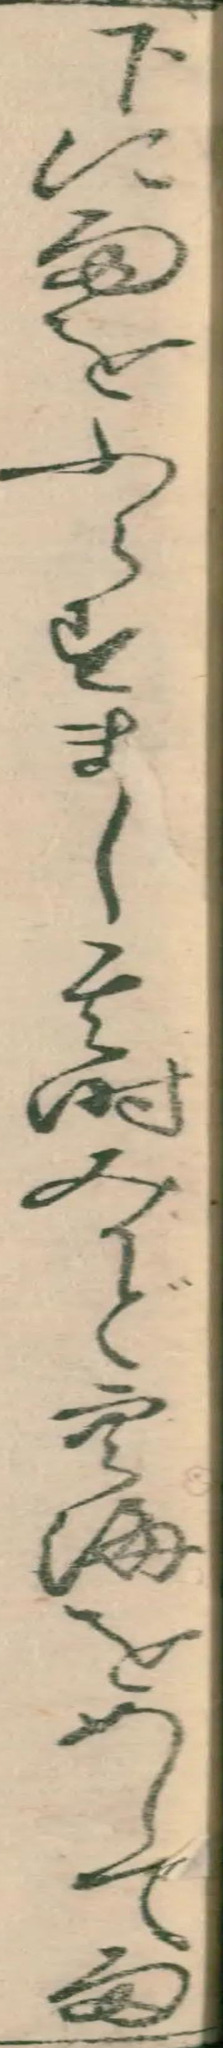下に雨をふらすまし其時みかど空海をめして雨
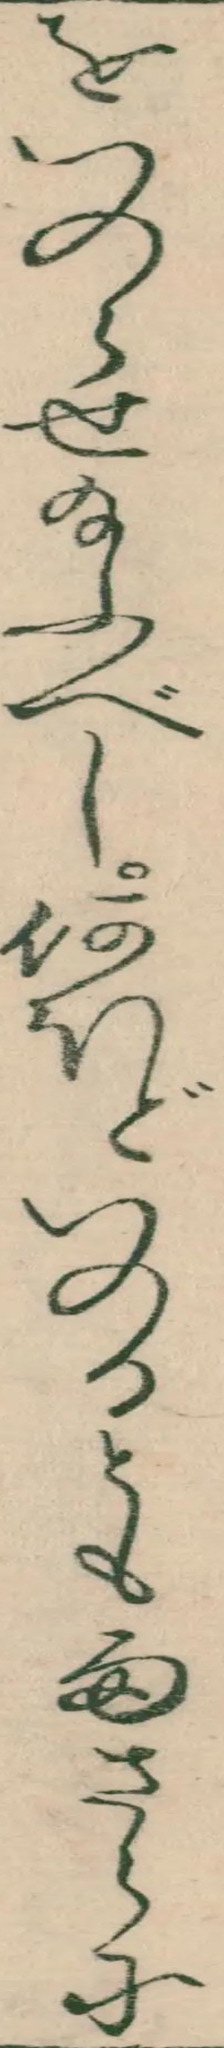をいのらせ給ふべし。何ほどいのるとも雨さらに
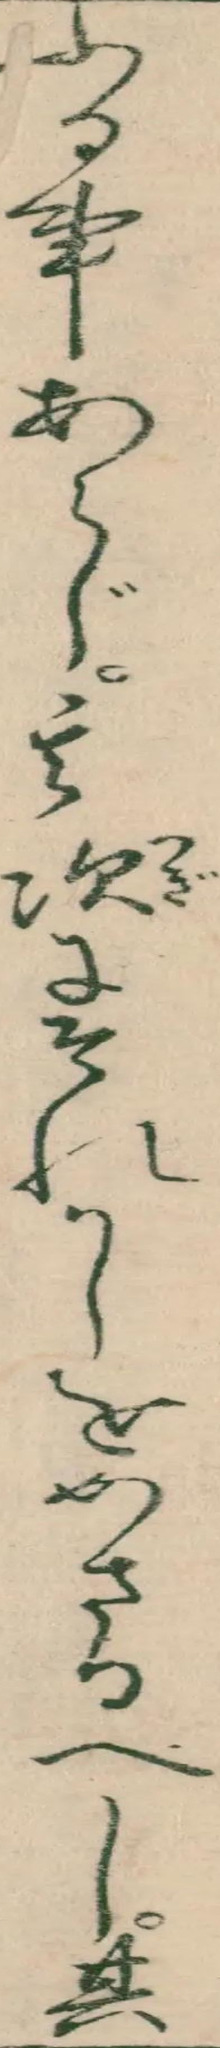ふる事あらじ。其次にそれかしをめさるへし。其
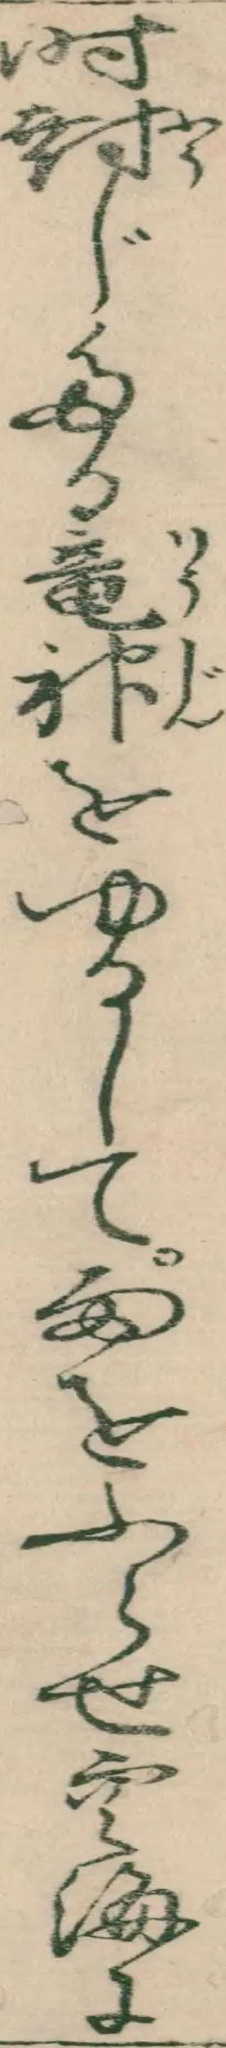時封じたる竜神をゆるして。雨をふらせ空海に
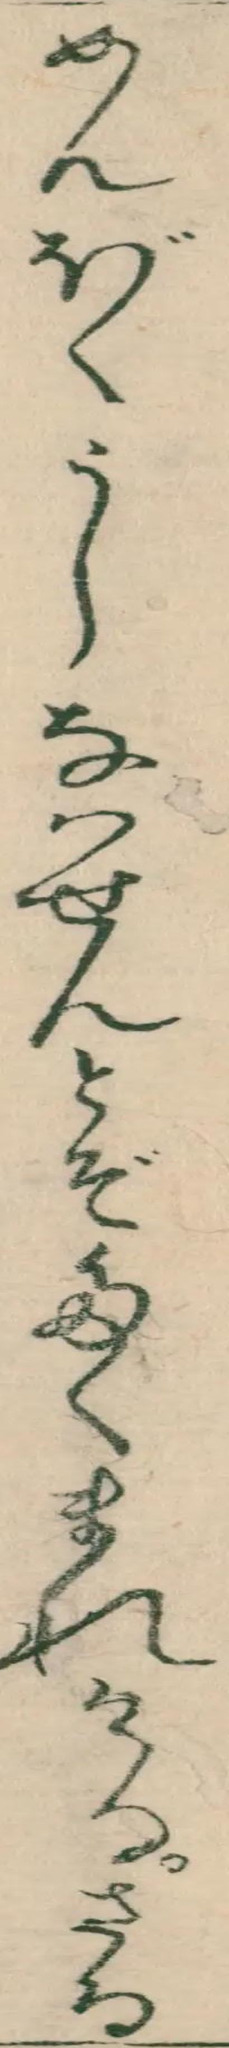めんぼくうしなはせんとぞたくまれける。さる
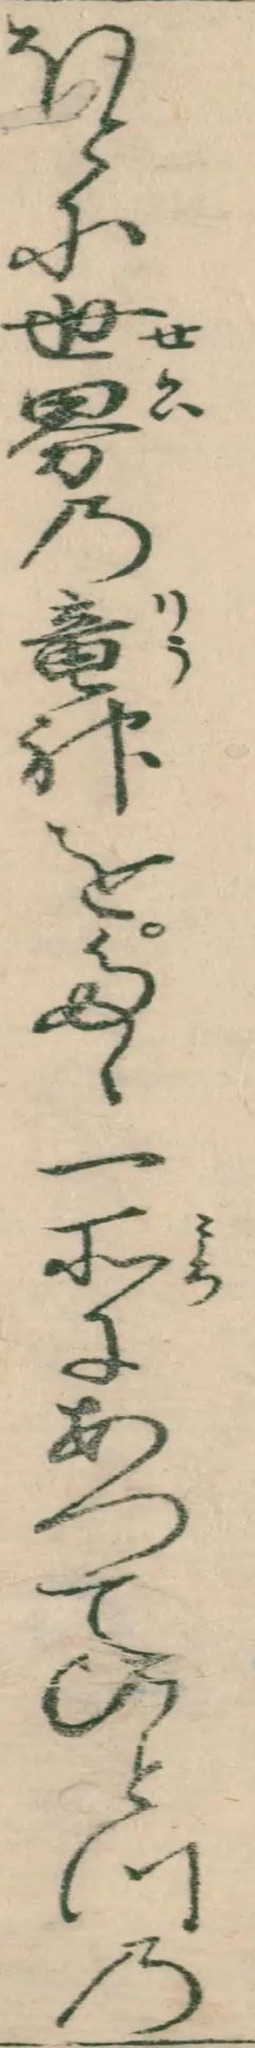ほとに世界の竜神を。たゝ一所にあつてひとつの
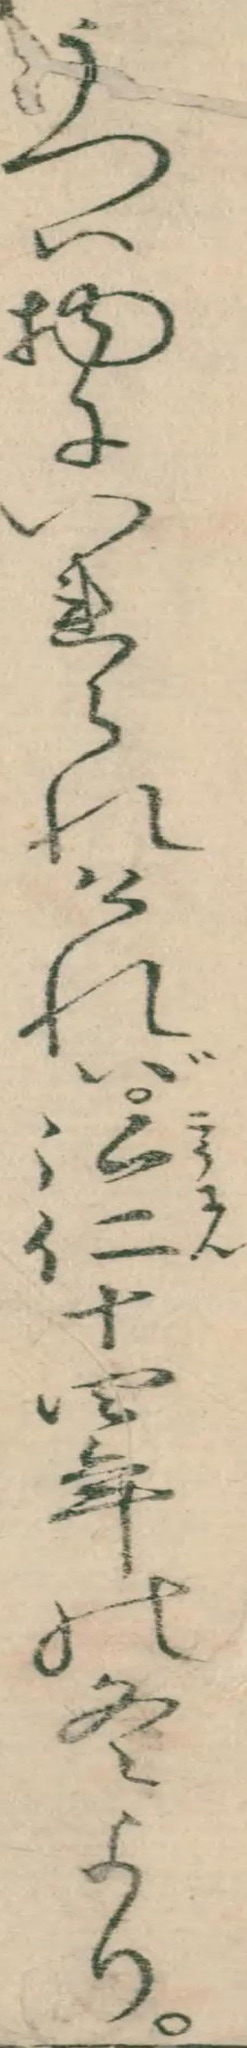うつは物にいれられければ。弘仁十四年の冬より。
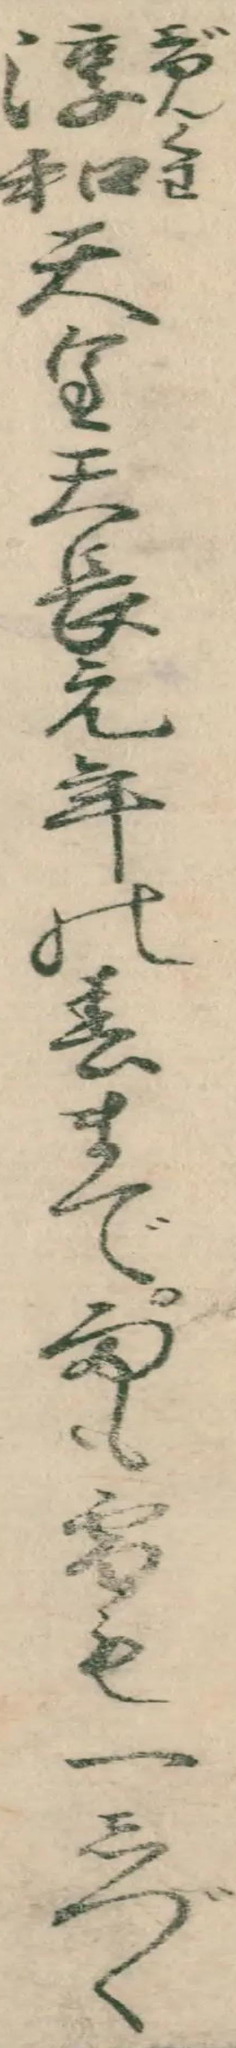淳和天皇天長元年の春まで雨も雪も一しづく
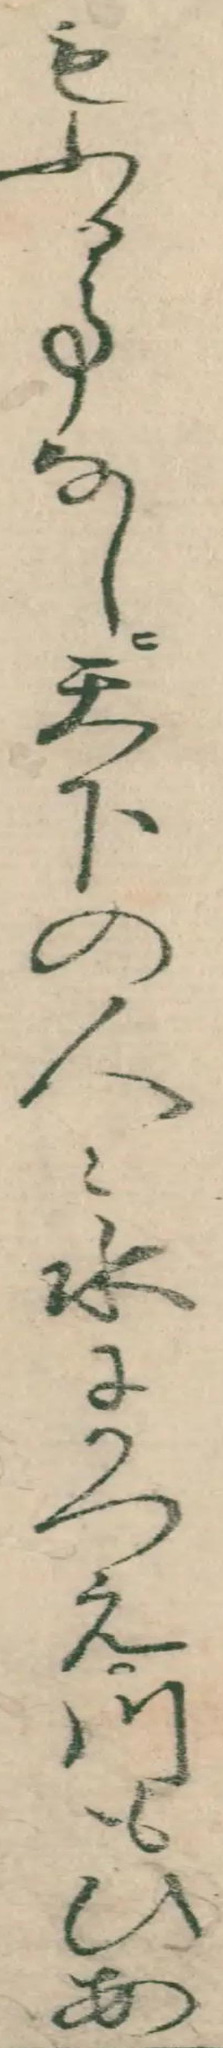もふる事なし。天下の人々水にかつえ。川もひあ
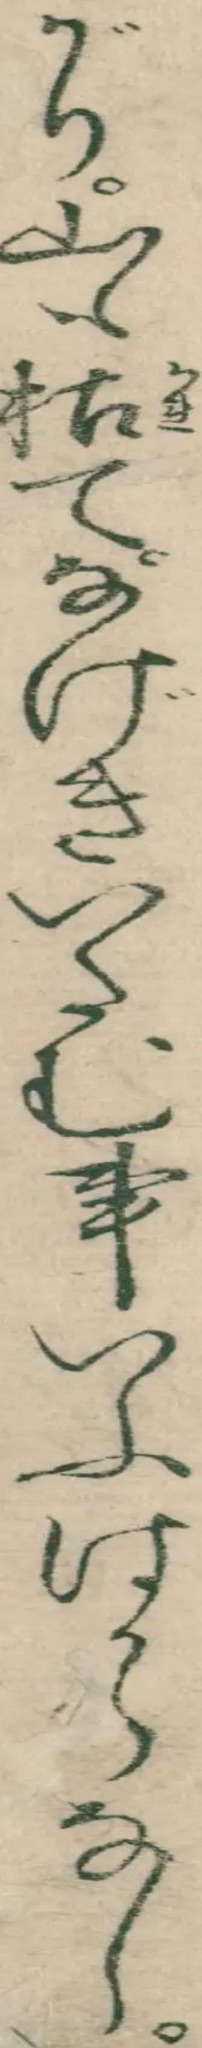がり。山も枯て。なげきいたむ事いふはからなし。

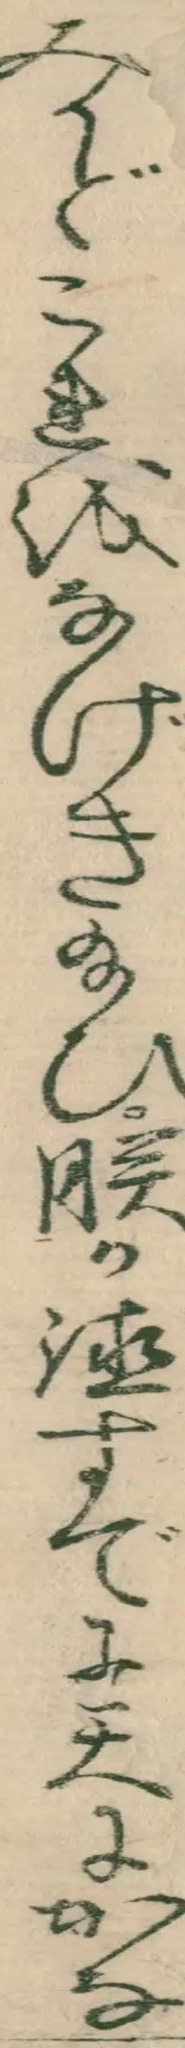みかどこれをなげき給ひ。朕か徳すでに天にかな
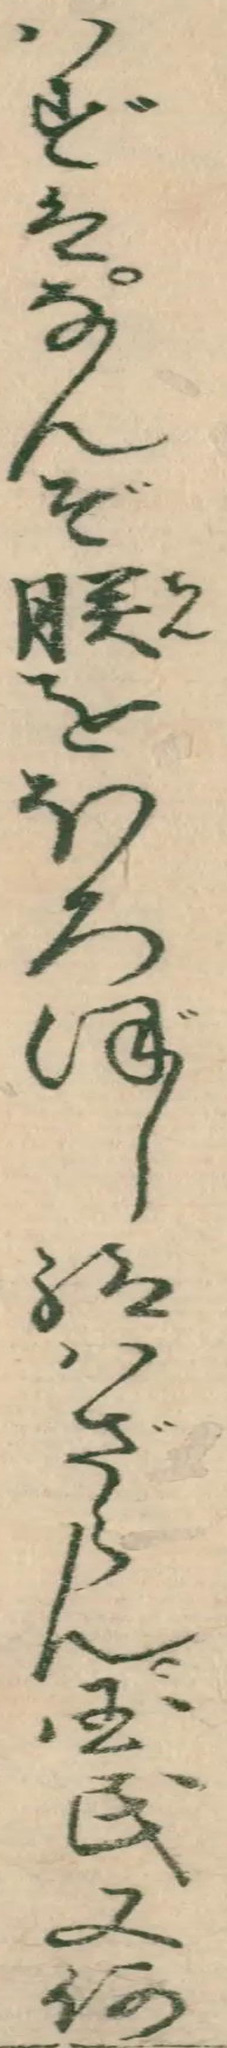はずは。なんぞ朕をほろぼし給はざらん。国民又何
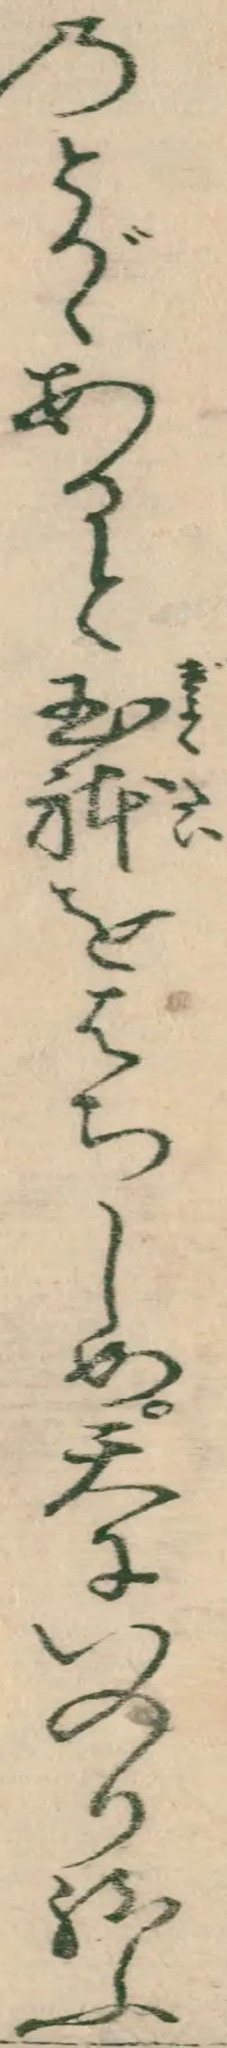のとがゞあると玉体をはちしめ。天にいのり給ふ
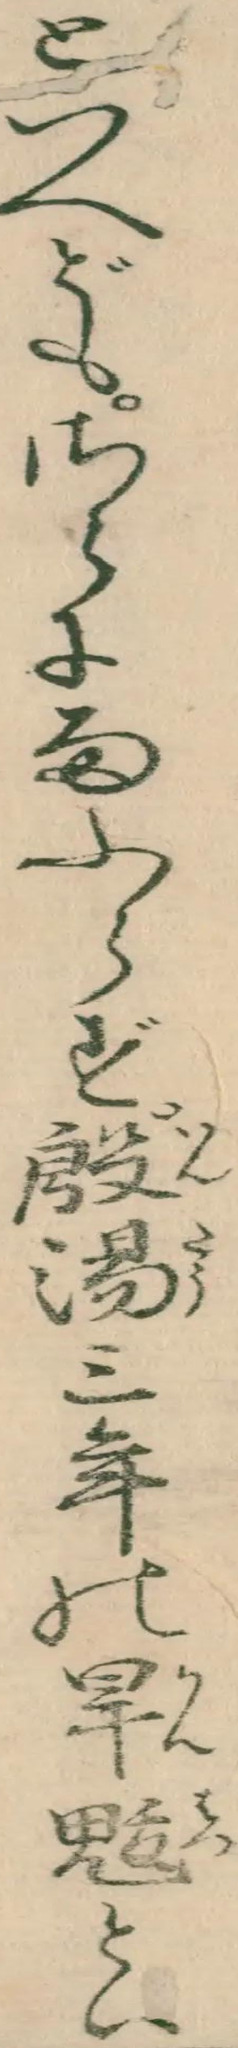といへども。さらに雨ふらず。殷湯三年の旱魃とは
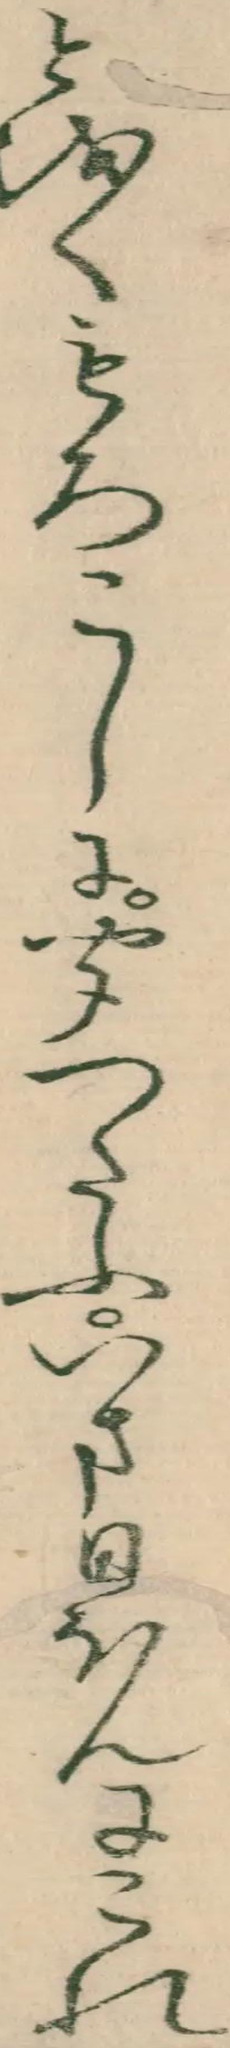とほくもろこしに。聞つたふ。いま日ほんにこれ
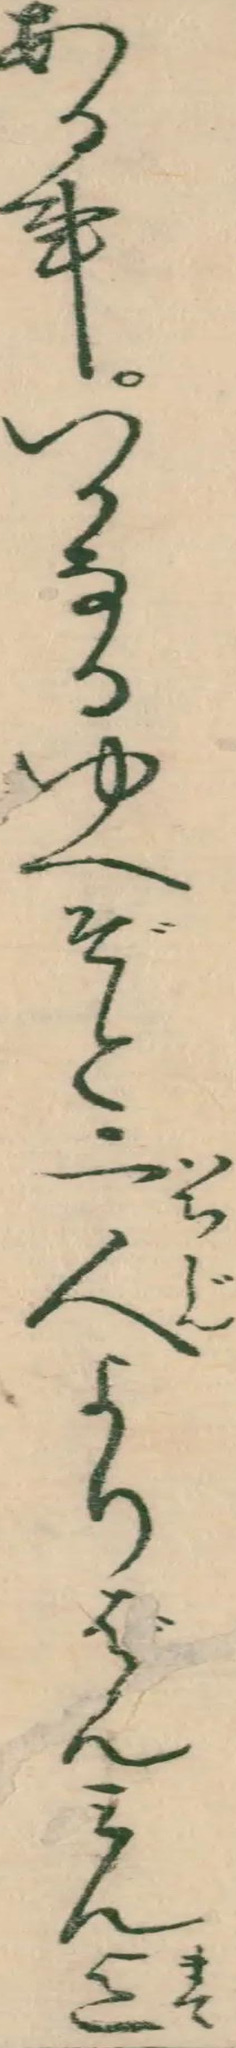ある事。いかなるゆへぞと。一人よりばんみん迄
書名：弘法大師御本地 3巻. [2]
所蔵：国立国会図書館 National Diet Library, JAPAN
